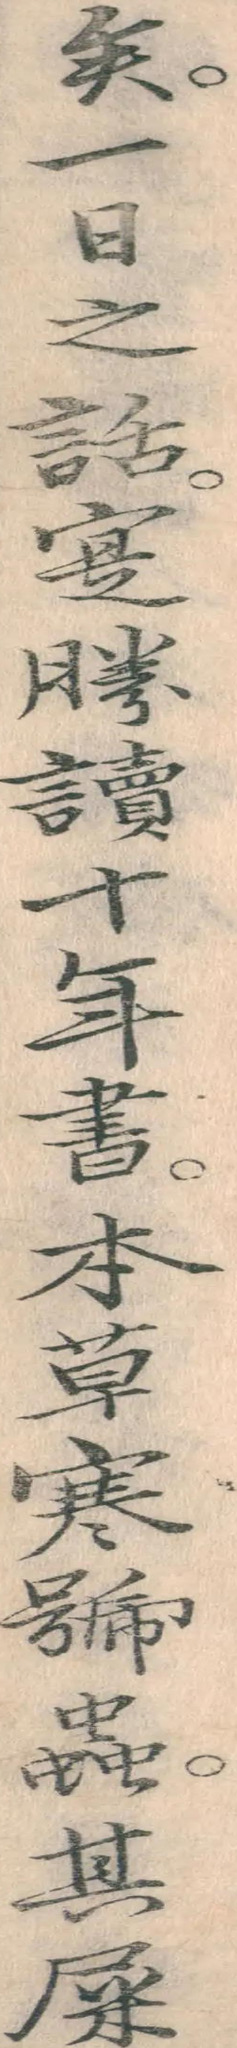矣。一日之話。寔勝読十年書。本草寒号虫。其屎

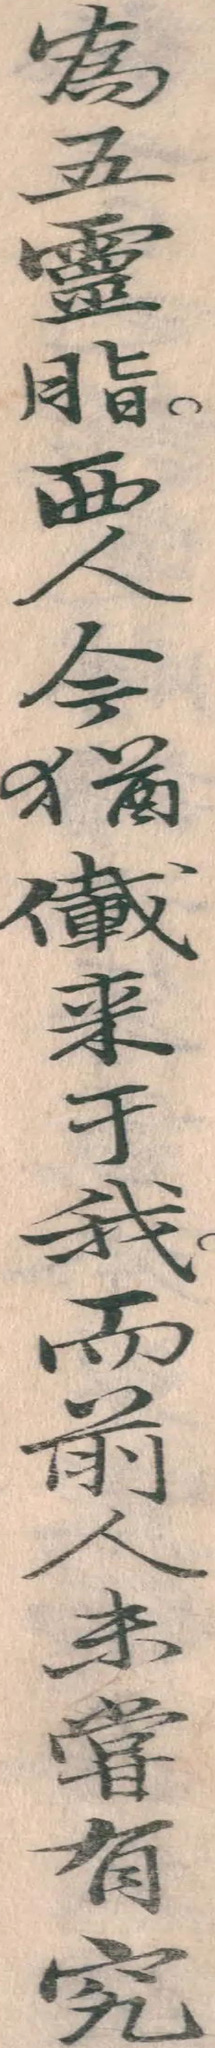為五霊脂。西人今猶儎来于我。而前人未嘗有究
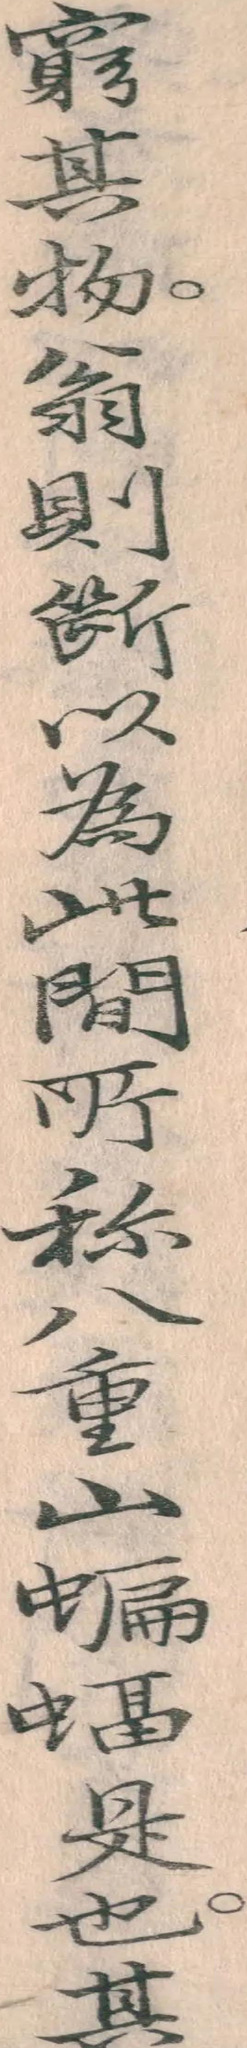窮其物。翁則断以為此間所称八重山蝙蝠是也。其
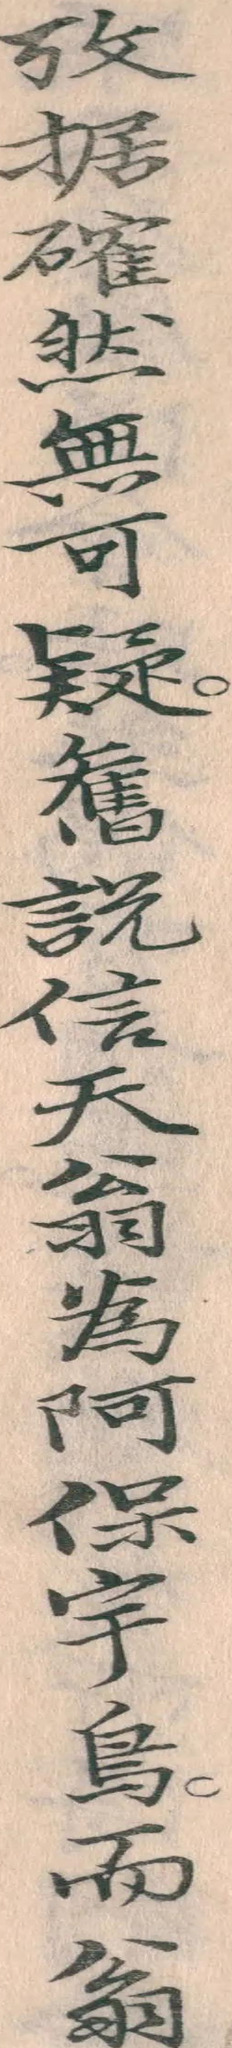攷据確然無可疑。旧説信天翁為阿保宇鳥。而翁
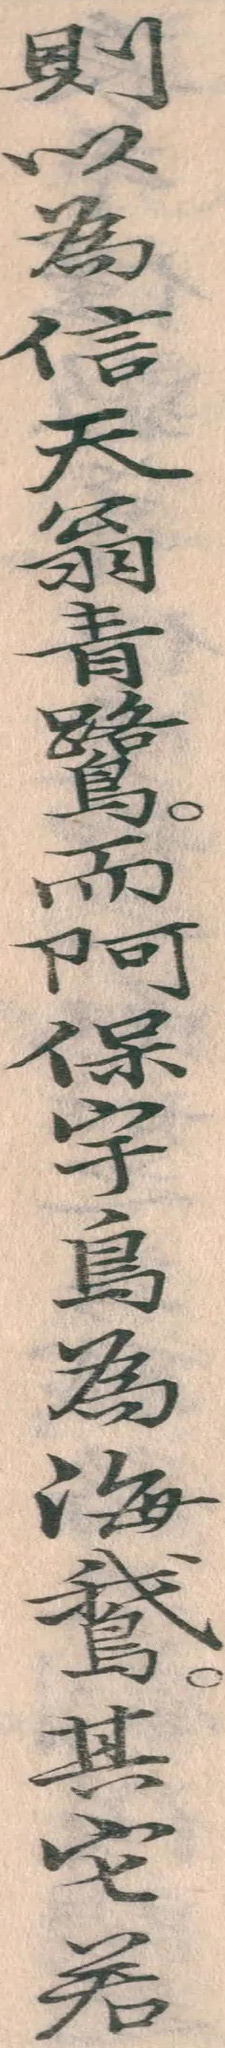則以為信天翁青鷺。而阿保宇鳥為海鵞。其它若
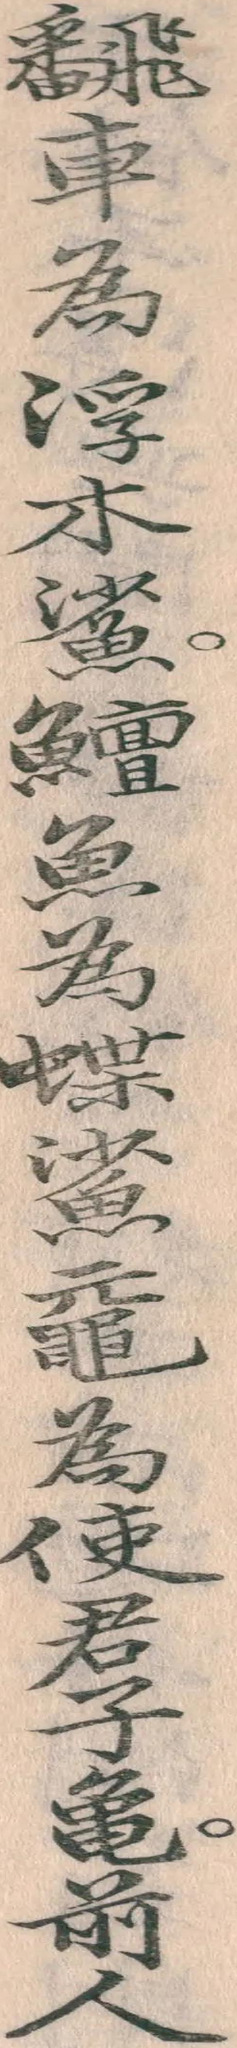翻車為浮木鯊。鱣魚為蝶鯊黿為使君子亀。前人
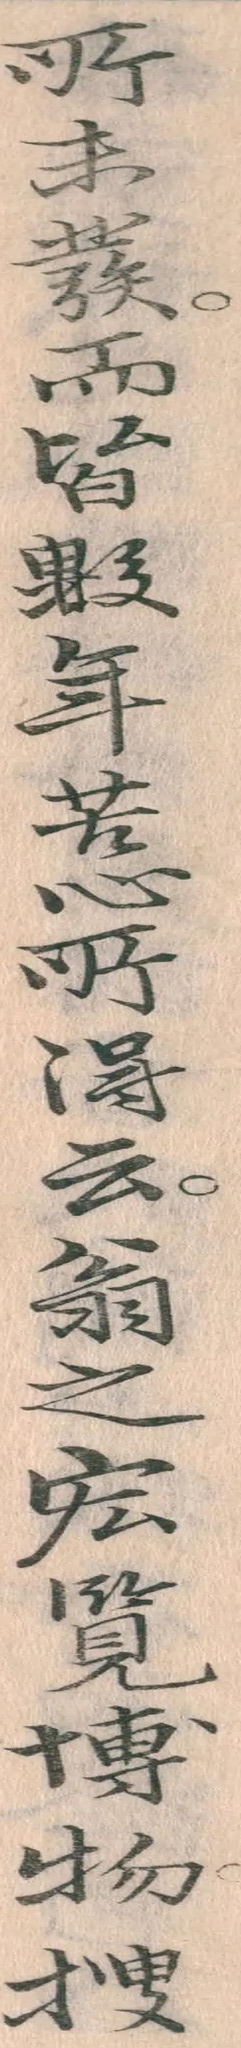所未発。而皆数年若心所得云。翁之宏覧博物捜
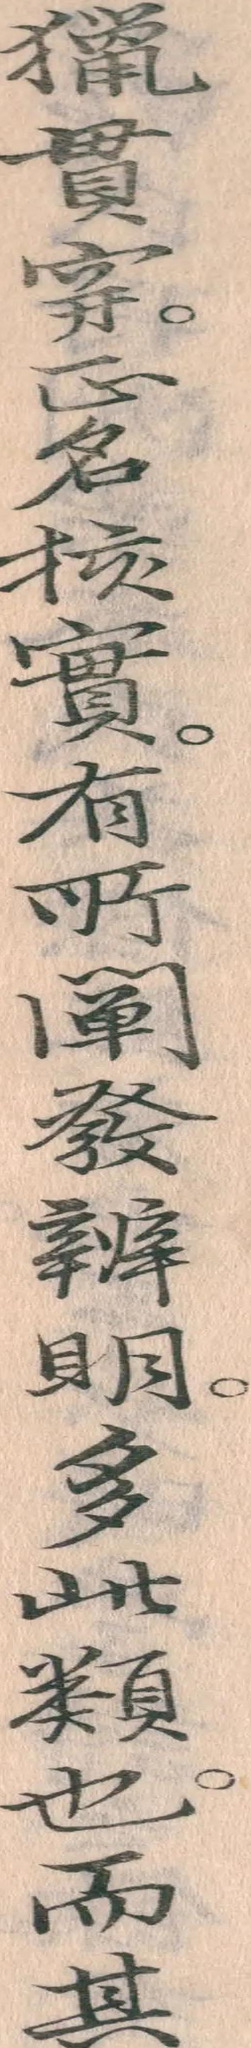猟貫穽。正名核実。有所闡発弁明。多此類也。而其
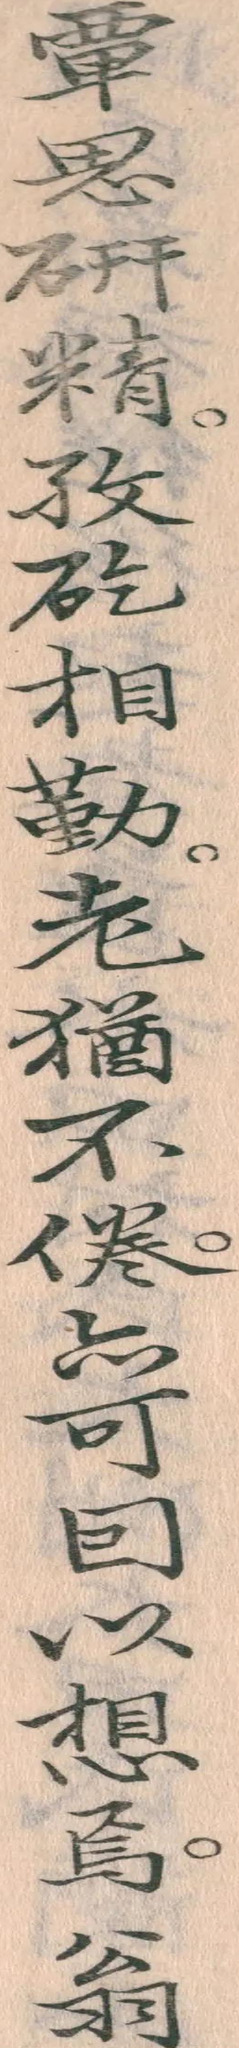覃思研精。孜矻相勤。老猶不倦。亦可回以想焉。翁
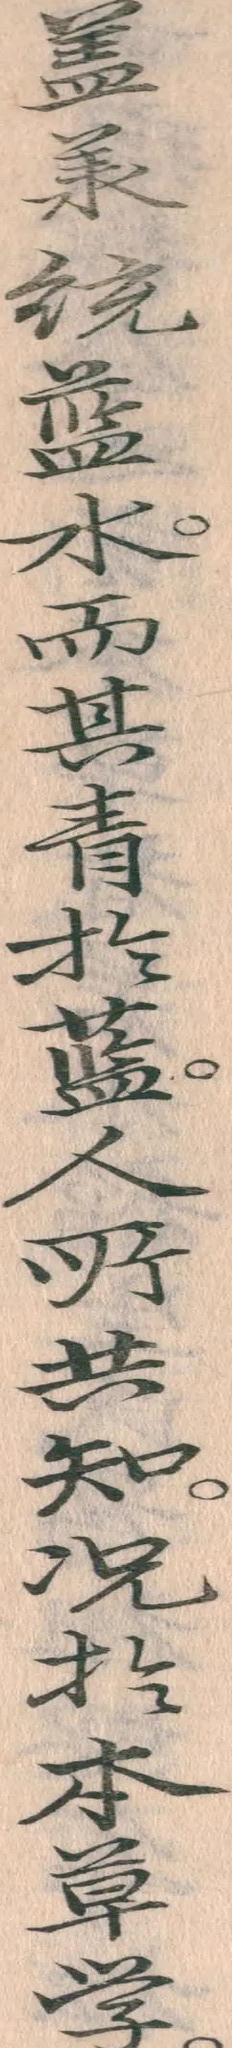蓋承統藍水。而其青於藍。人所共知。況於本草学。
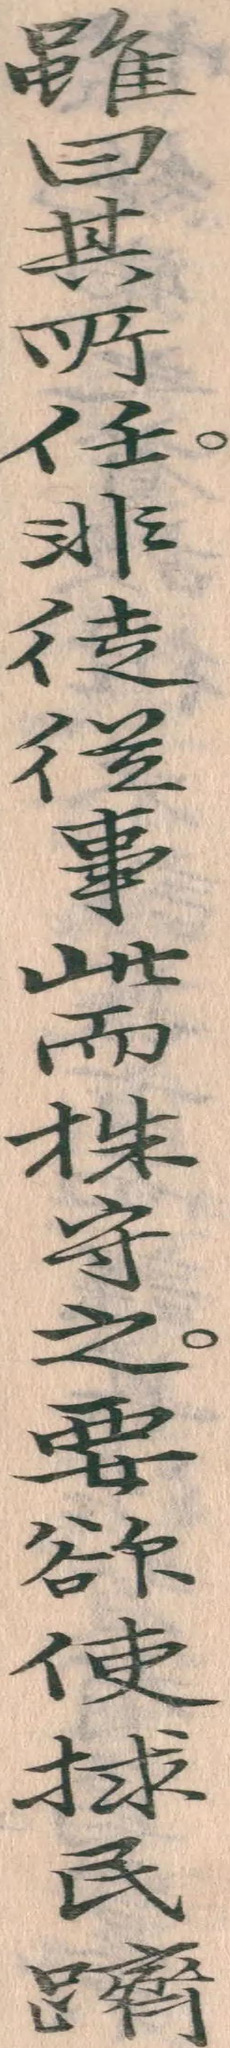雖曰其所任。非徒従事此而株守之。要欲使捄民躋
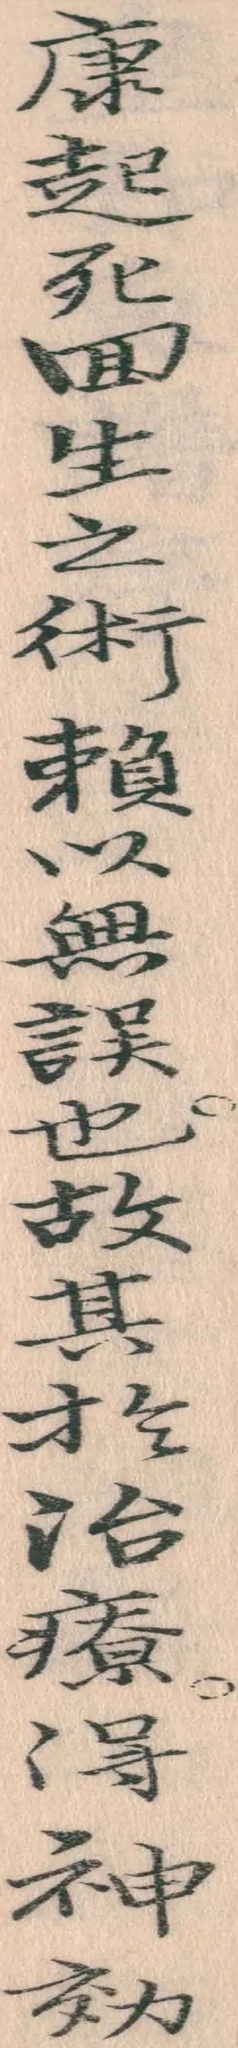康起死回生之術頼以無誤也。故其於治療。得神効
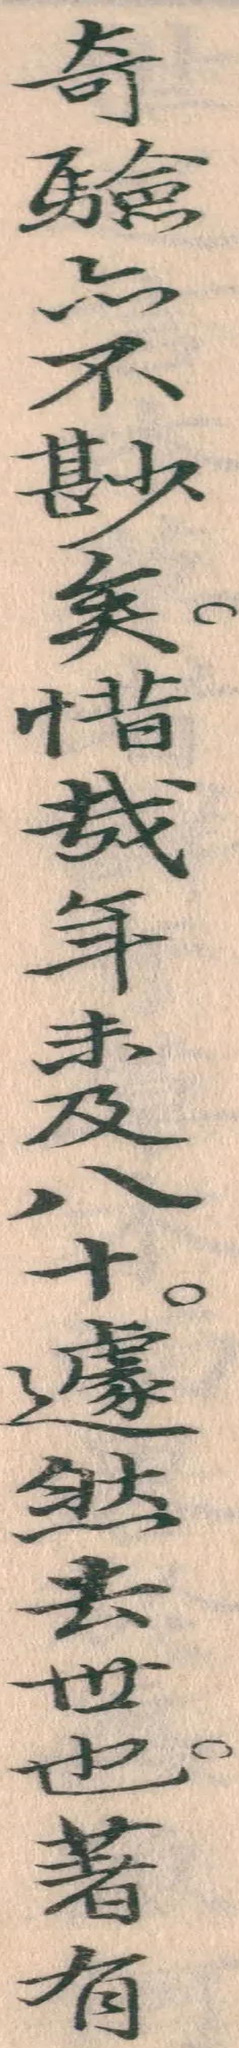奇験亦不尠矣。惜哉年未及八十。遽然去世也。著有
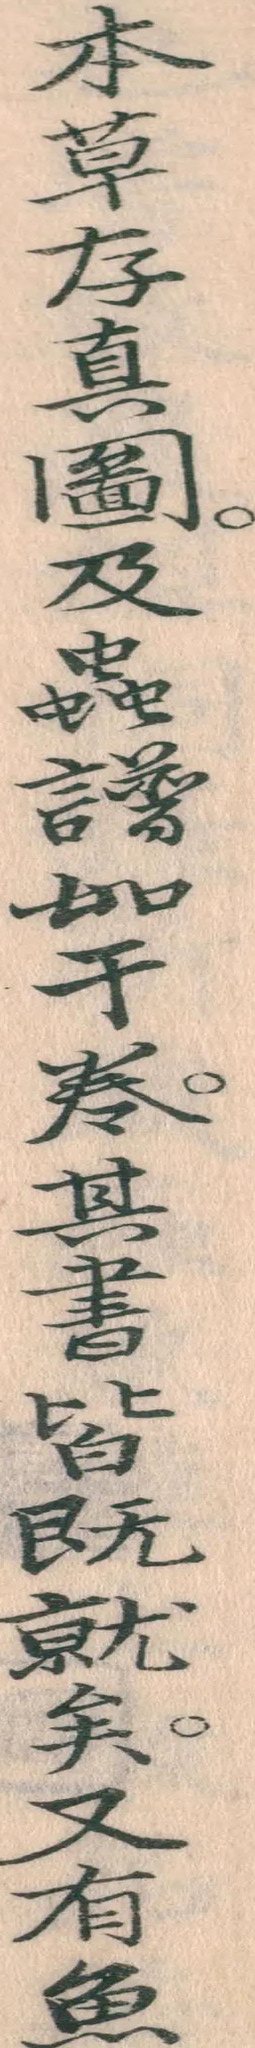本草存真図。及虫譜如于巻。其書皆既就矣。亦有魚
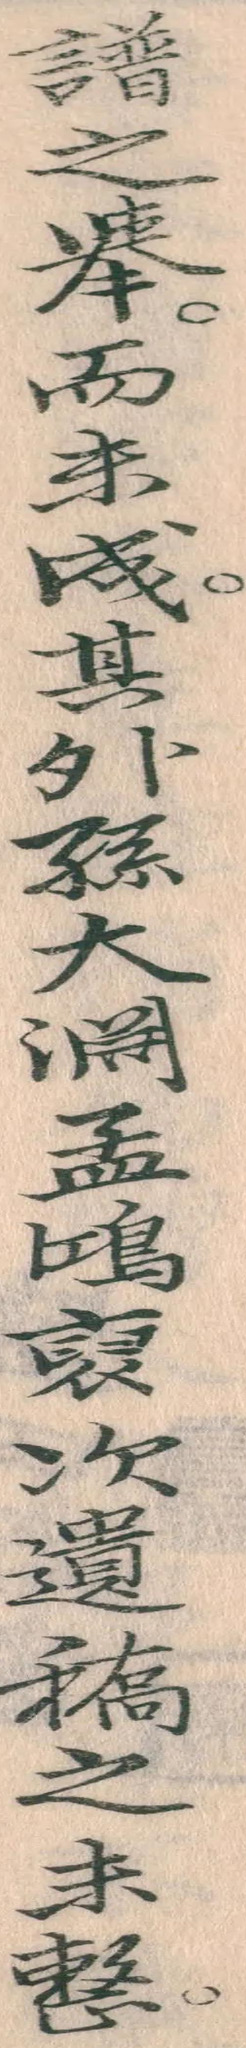譜之挙。而未成。其外孫大淵孟鴻裒次遺稿之未整。
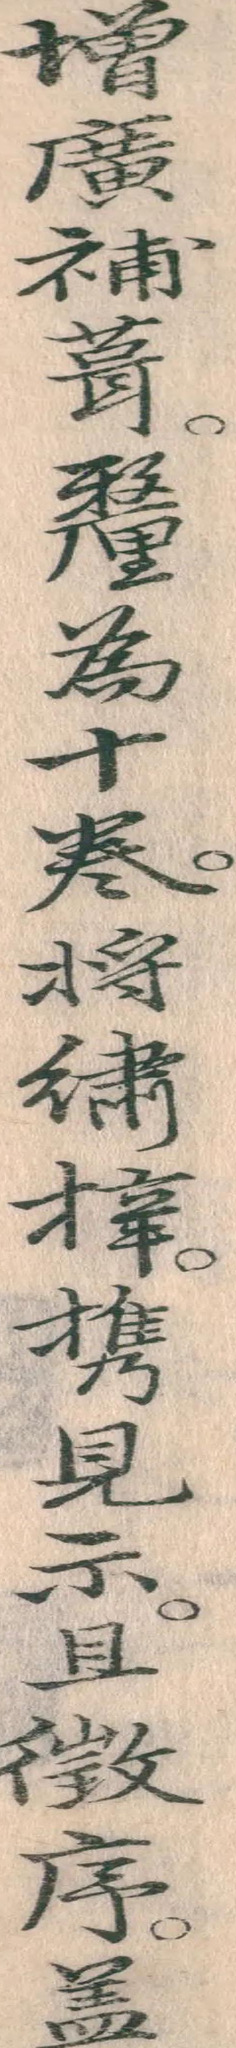増広補葺。釐為十巻。将繡梓。携見示。且徴序。蓋
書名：皇和魚譜 2巻
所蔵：国立国会図書館 National Diet Library, JAPAN
